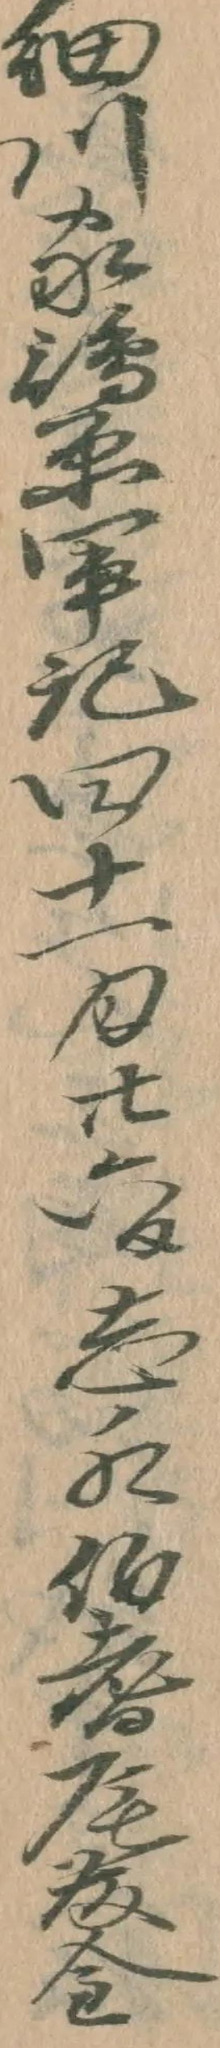細川家島原軍記曰十一月廿六日志水伯耆屋敷金
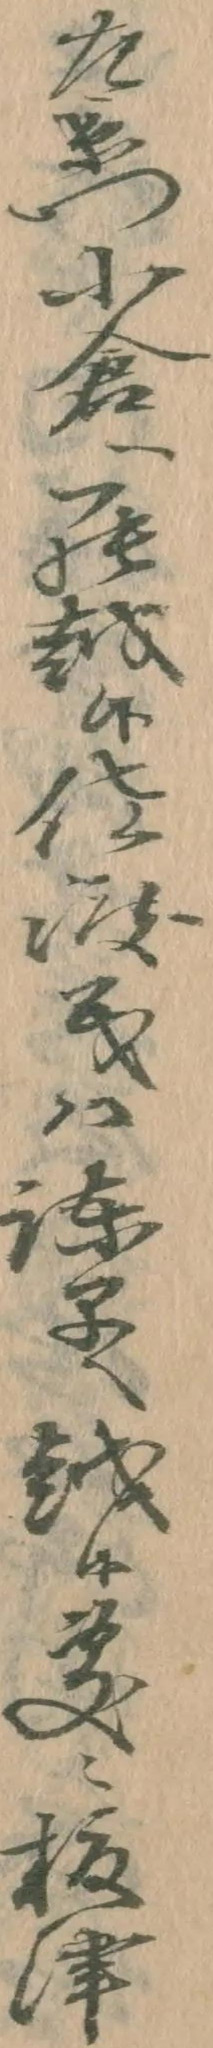左衛門小倉へ罷越候佐渡義は諫早へ越候処に板津
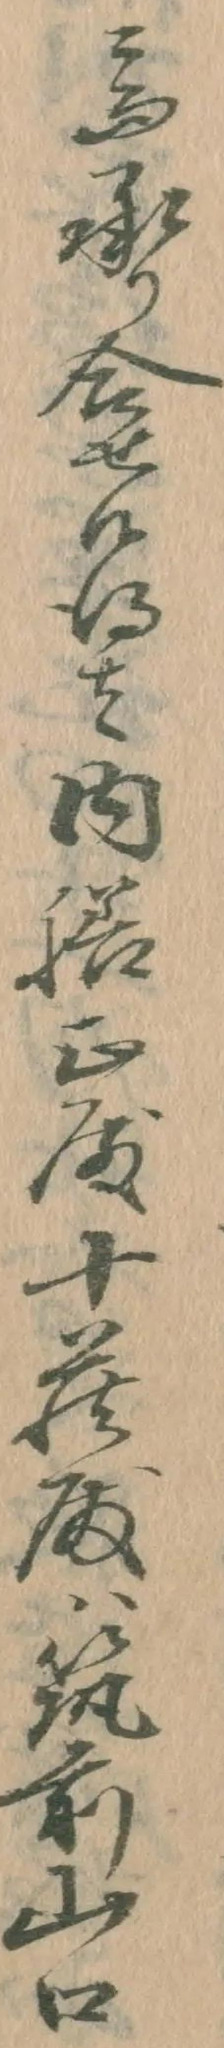に而承り合せ候得は内膳正殿十蔵殿は筑前山口
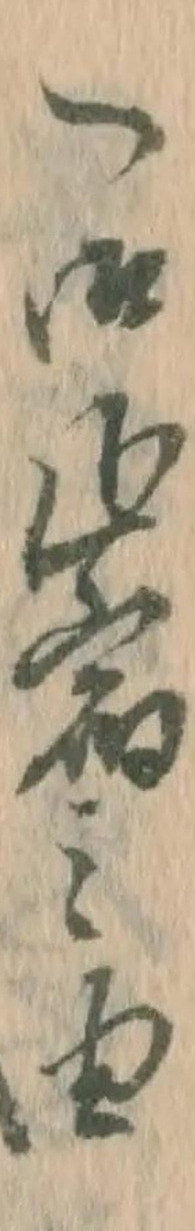へ御止宿之由
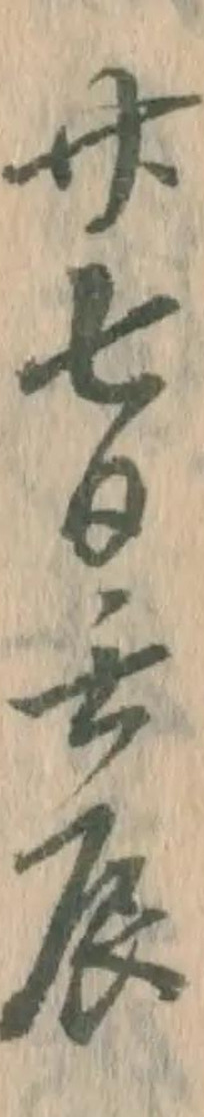廿七日壬辰
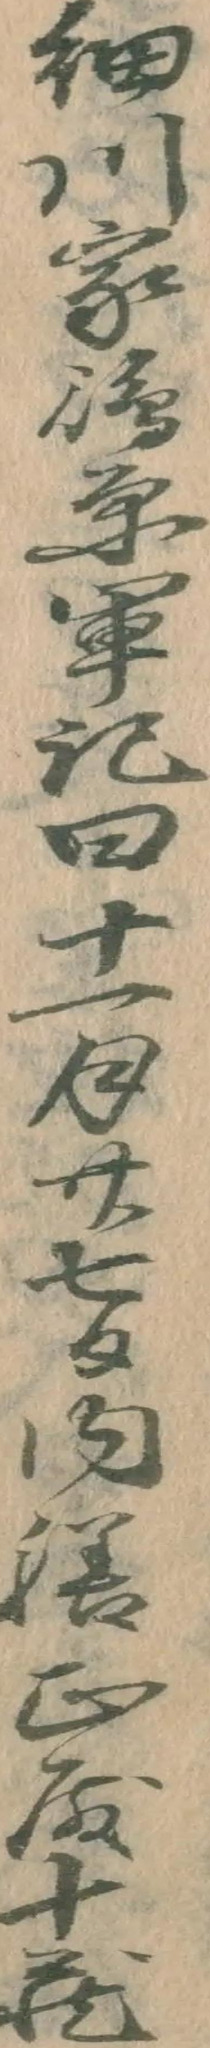細川家島原軍記曰十一月廿七日内膳正殿十蔵
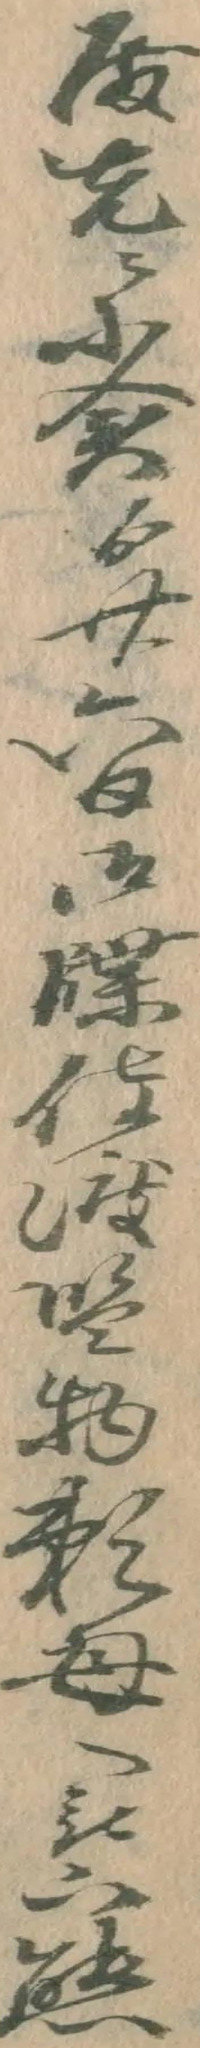殿先に小倉ゟ廿六日御牒佐渡監物頼母へ被下熊
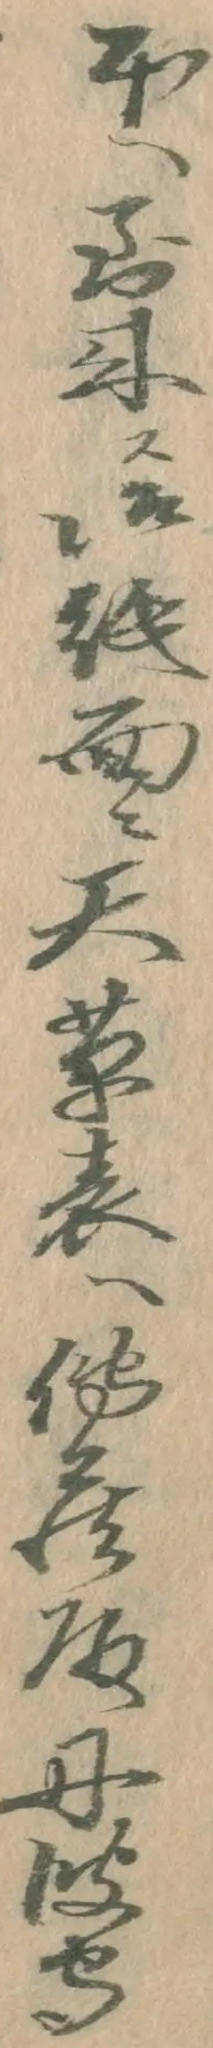本へ到来ス御紙面に天草表へ伝蔵殿丹波守
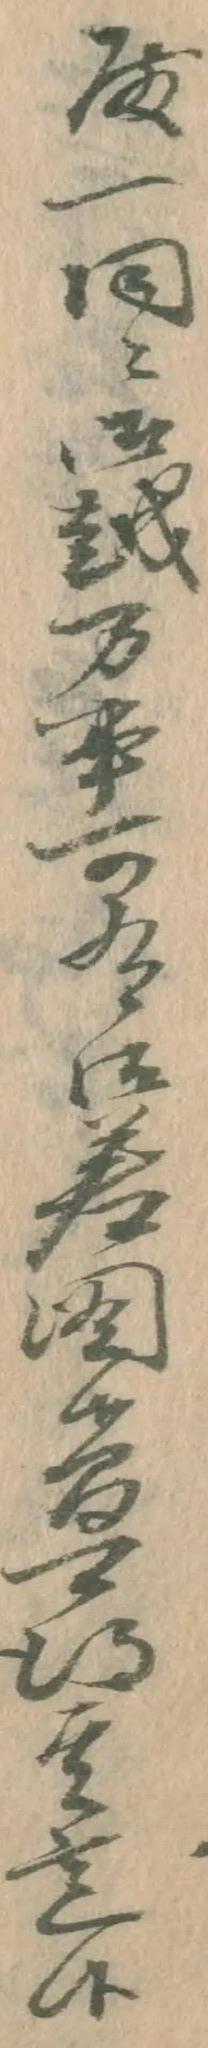殿一同に御越万事可有御差図候間可得其意候
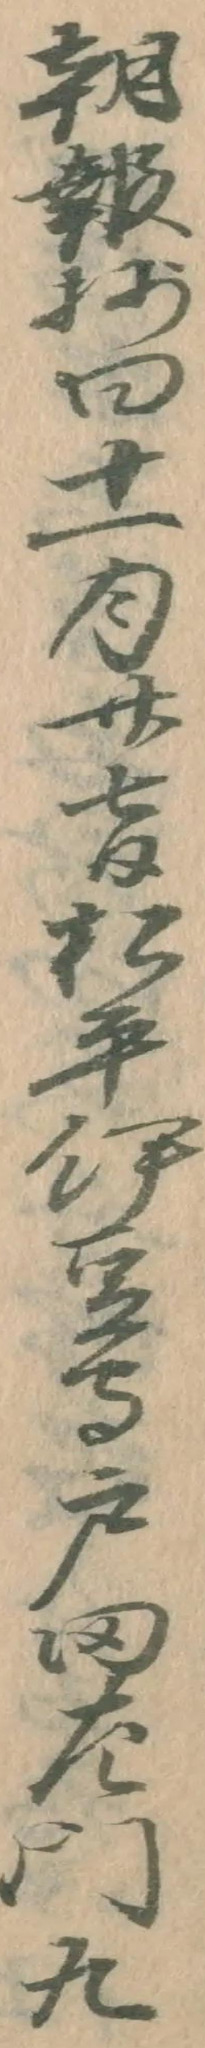朝報抄曰十一月廿七日松平伊豆守戸田左門九

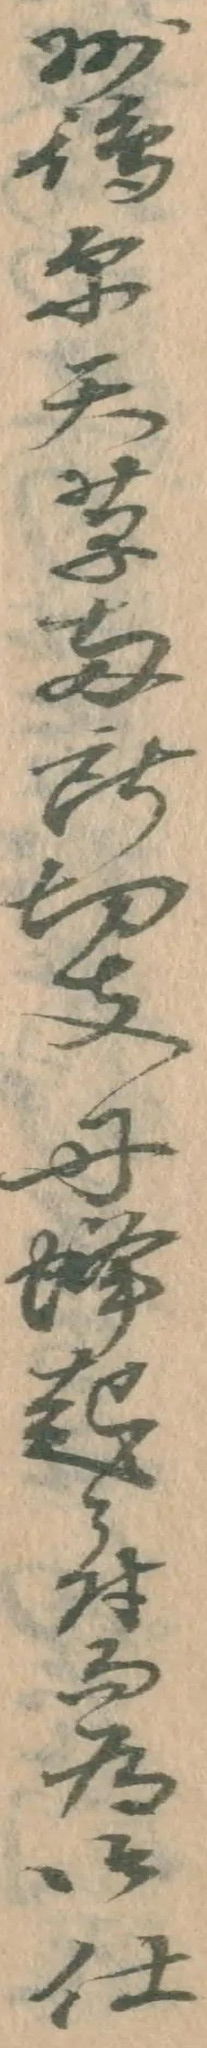州島原天草両所切支丹蜂起に付而為御仕
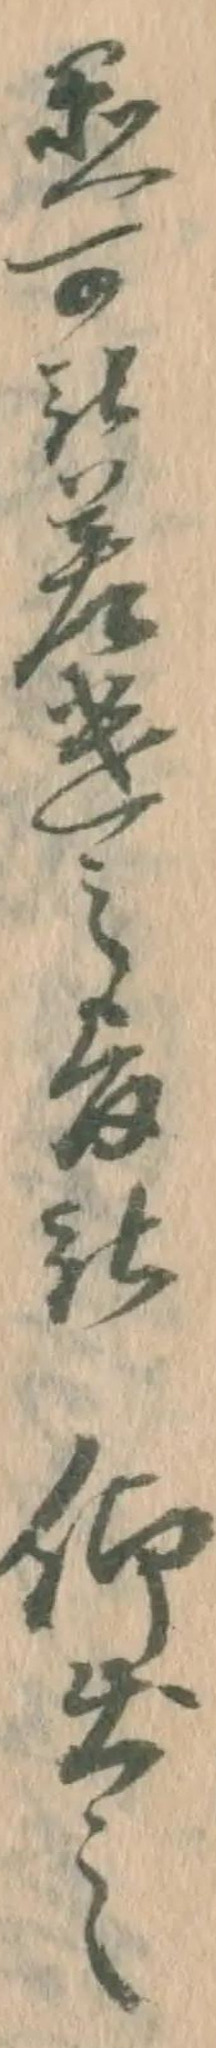置可被差遣之旨被仰出之
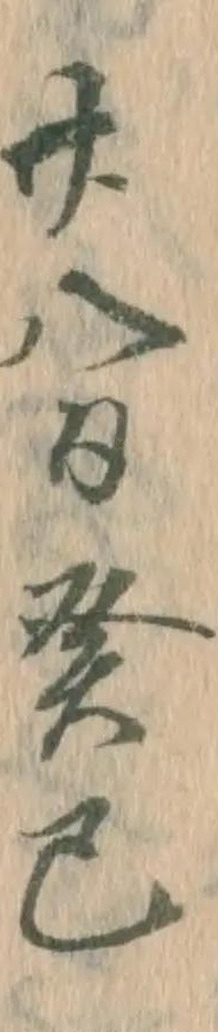廿八日癸巳
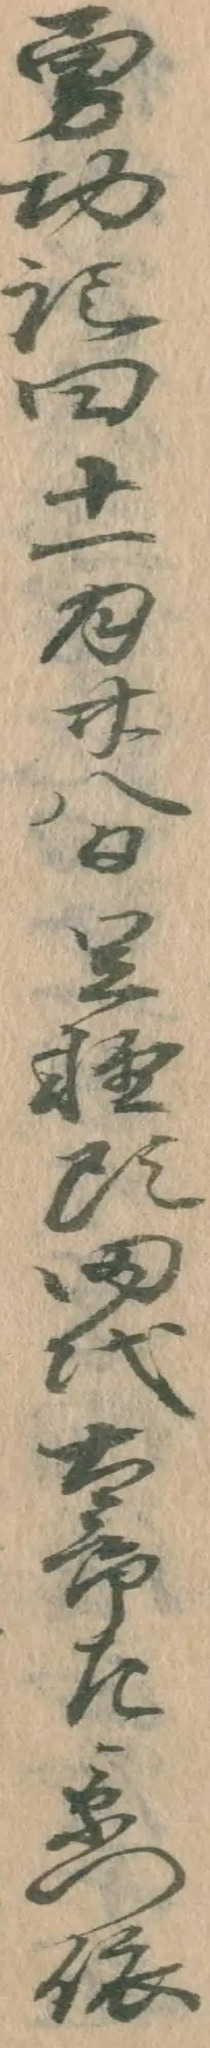勇功記曰十一月廿八日足軽頭田代太郎左衛門依
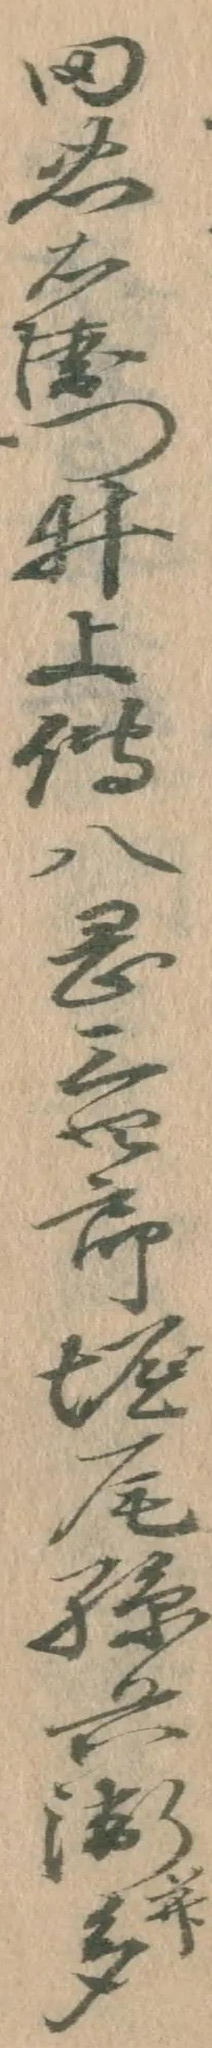田忠右衛門井上伝八岡三四郎掘尾孫兵衛并多
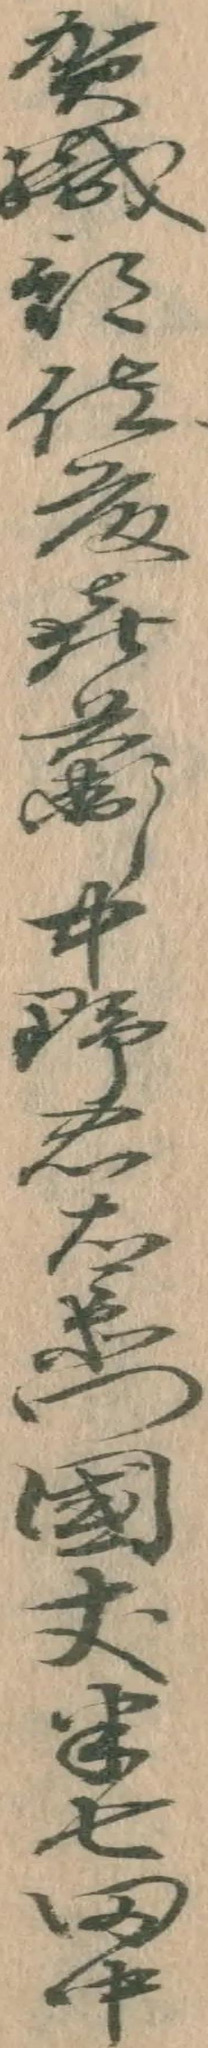賀織部佐藤喜兵衛中野忠右衛門国丈半七田中
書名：切支丹御退治記 49巻. [3]
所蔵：国立国会図書館 National Diet Library, JAPAN
